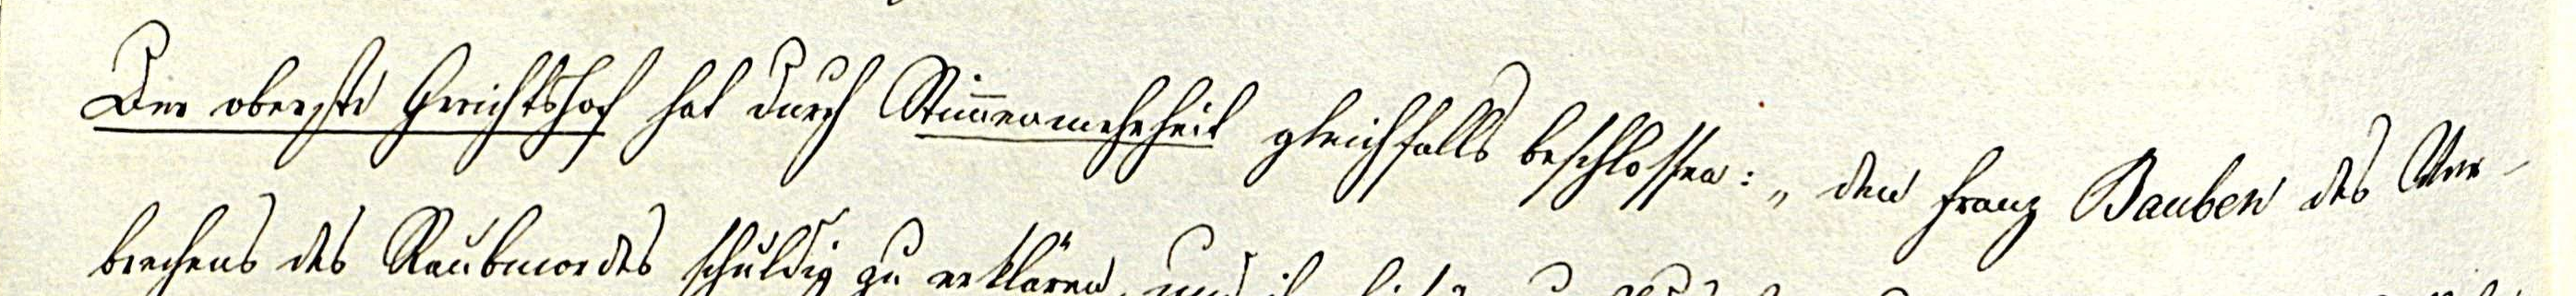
Der oberste Gerichtshof hat durch Stimmenmehrheit gleichfalls beschlossen: „den Franz Bauben des Ver¬
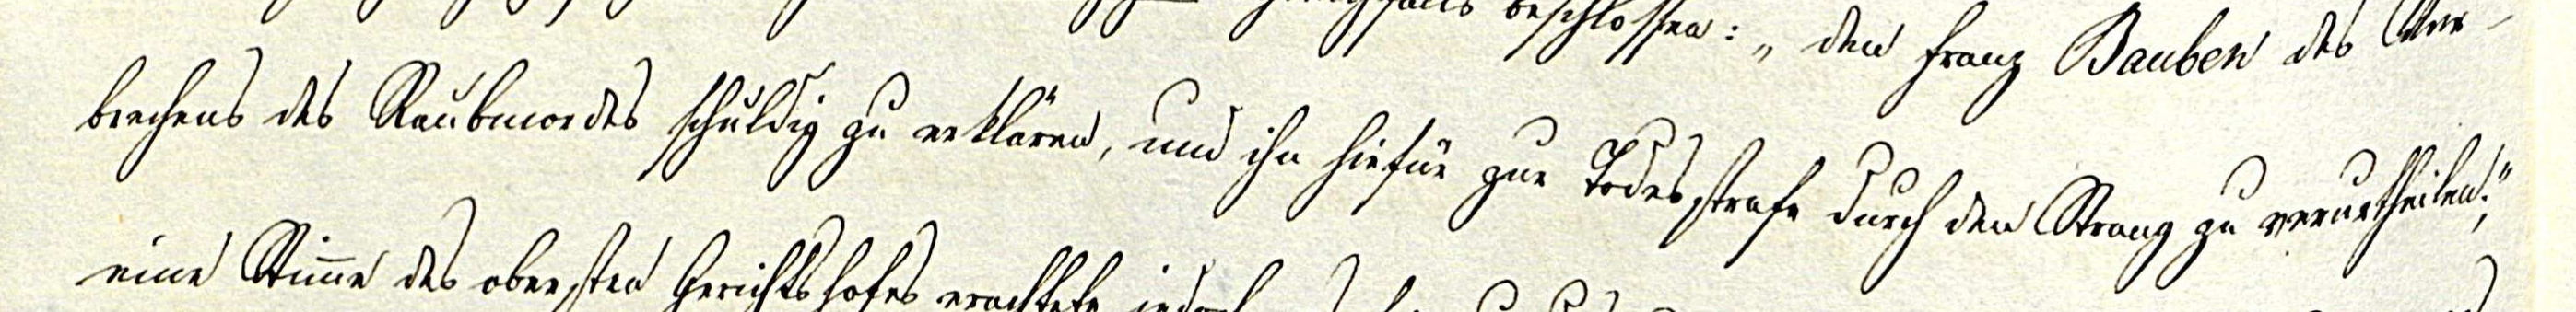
brechens des Raubmordes schuldig zu erklären, und ihn hiefür zur Todesstrafe durch den Strang zu verurtheilen“;
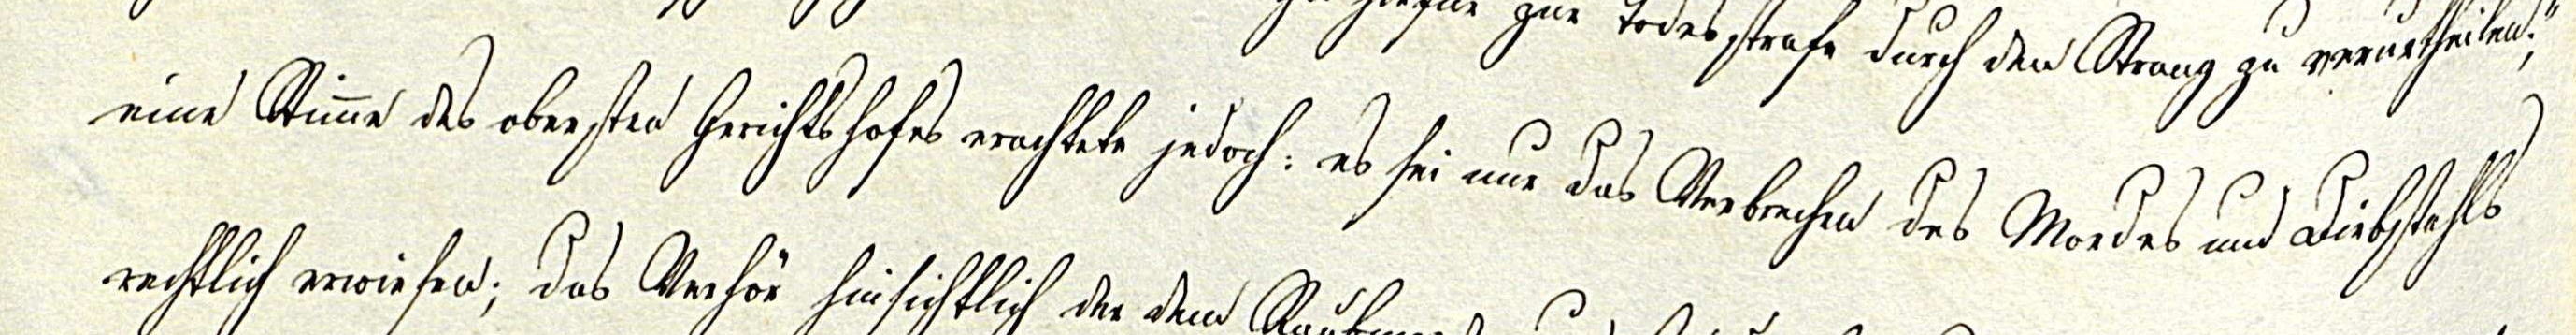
eine Stimme des obersten Gerichtshofes erachtete jedoch: es sei nur das Verbrechen des Mordes und Diebstahls
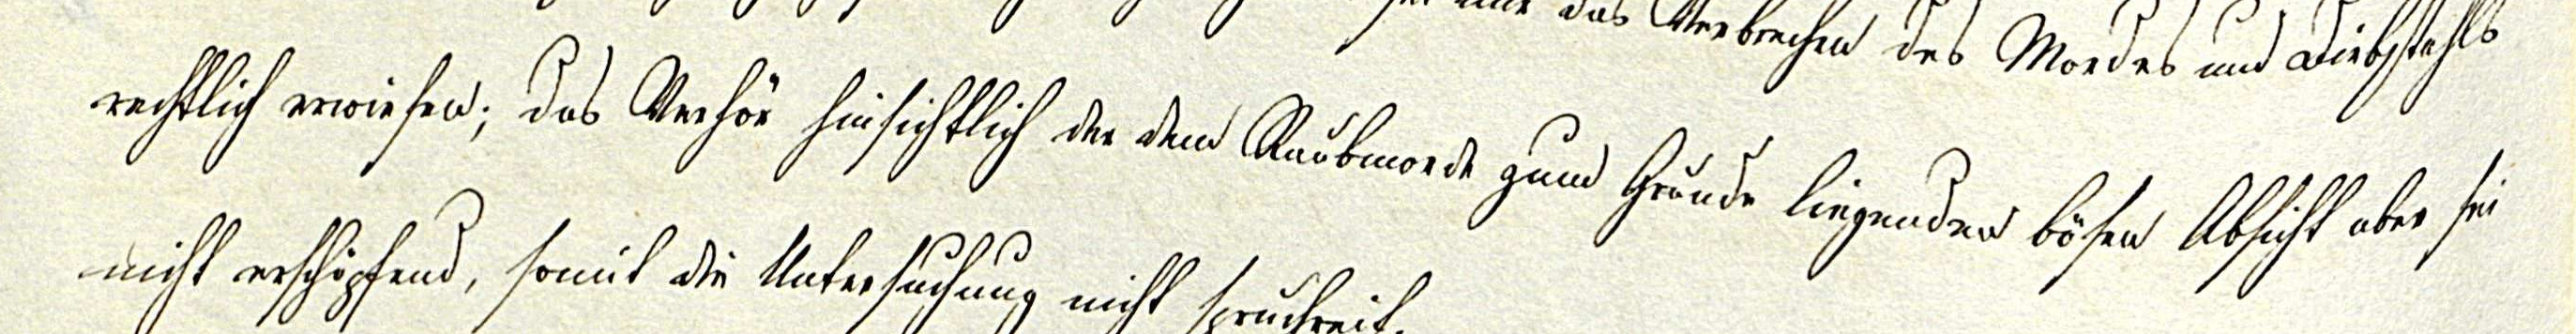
rechtlich erwiesen; das Verhör hinsichtlich der dem Raubmorde zum Grunde liegenden bösen Absicht aber sei
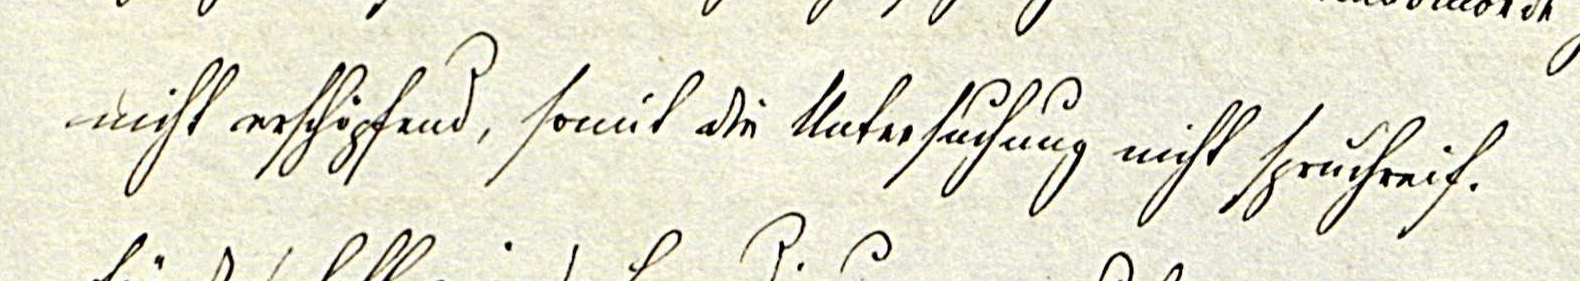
nicht erschöpfend, somit die Untersuchung nicht spruchreif.
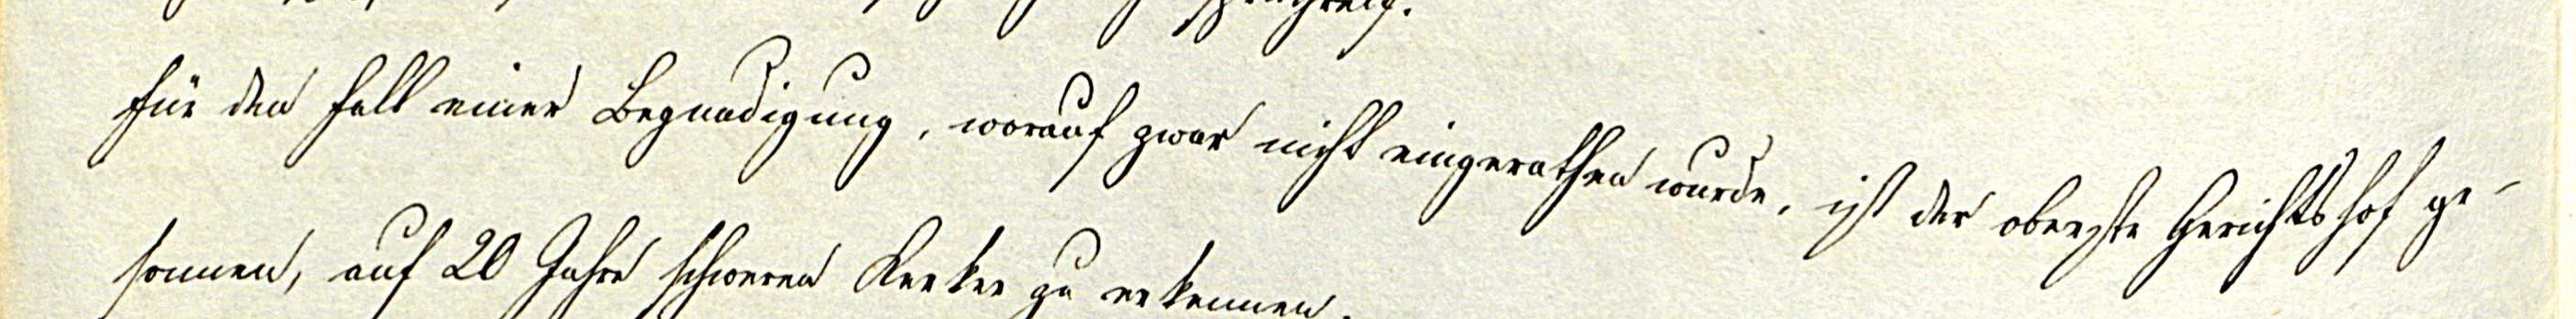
Für den Fall einer Begnadigung, worauf zwar nicht eingerathen wurde, ist der oberste Gerichtshof ge¬
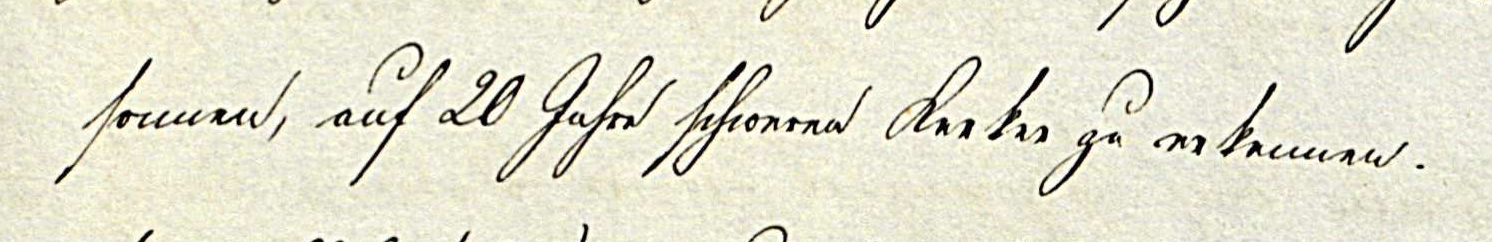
sonnen, auf 20 Jahre schweren Kerker zu erkennen.
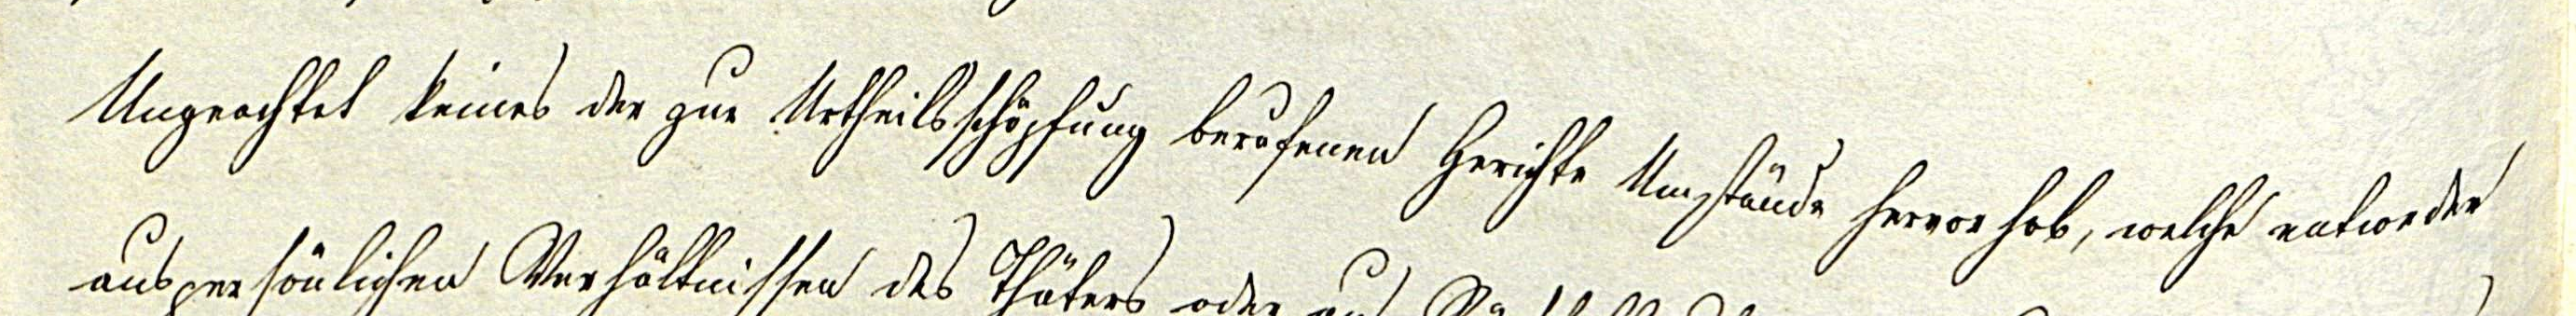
Ungeachtet keines der zur Urtheilsschöpfung berufenen Gerichte Umstände hervor hob, welche entweder
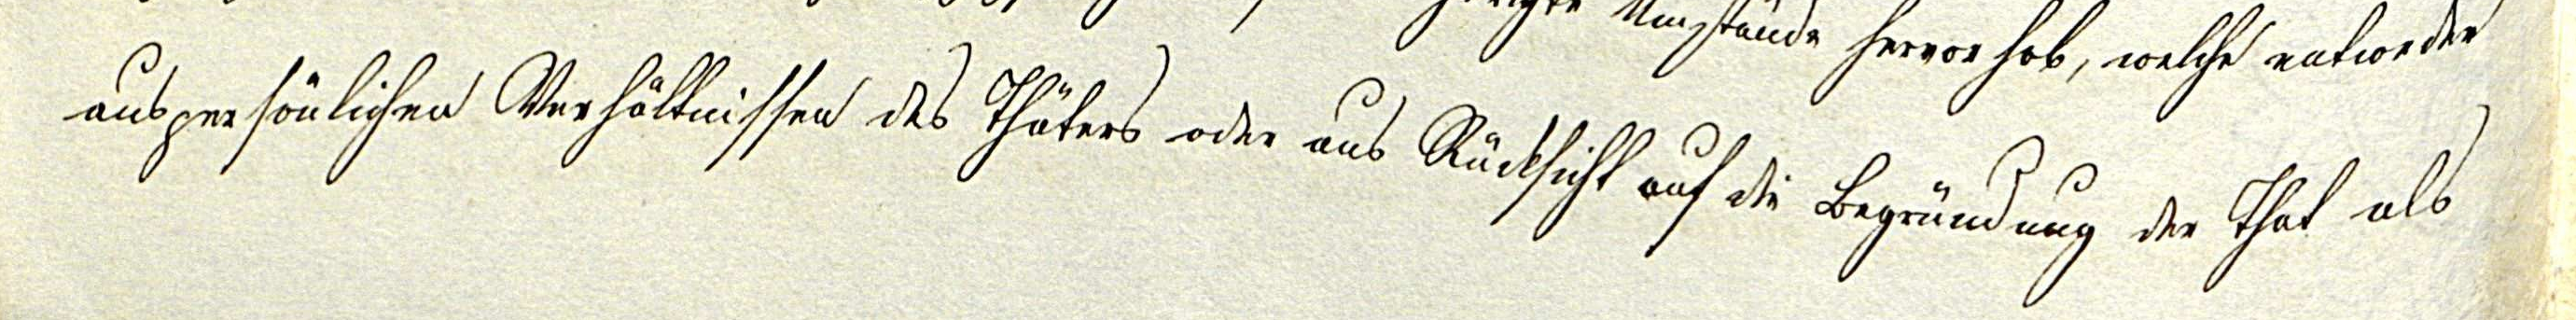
aus persönlichen Verhältnissen des Thäters oder aus Rücksicht auf die Begründung der That als
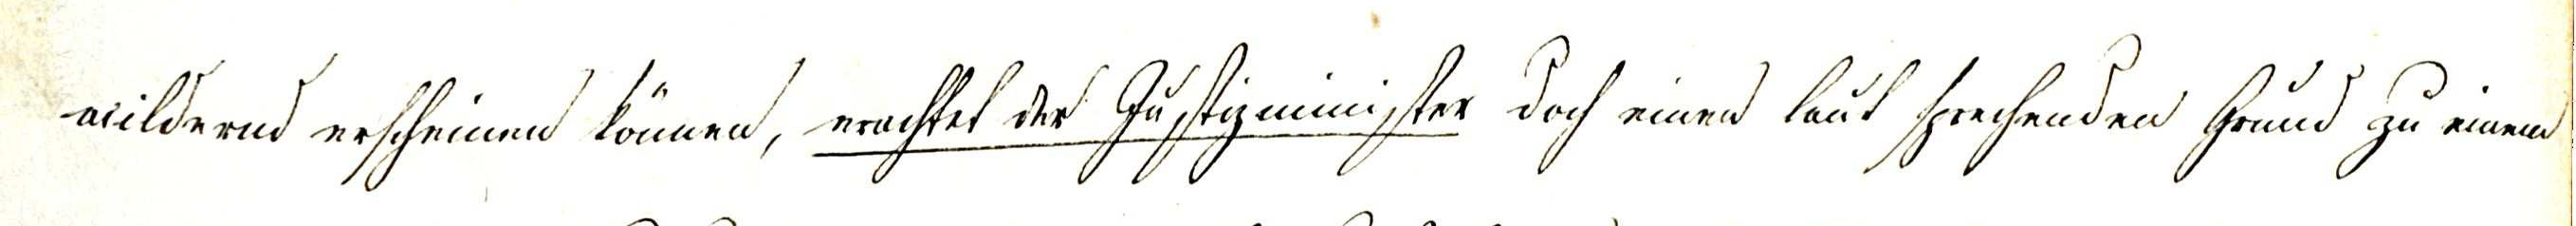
wildernd erscheinen können, erachtet der Justizminister doch einen laut sprechenden Grund zu einem
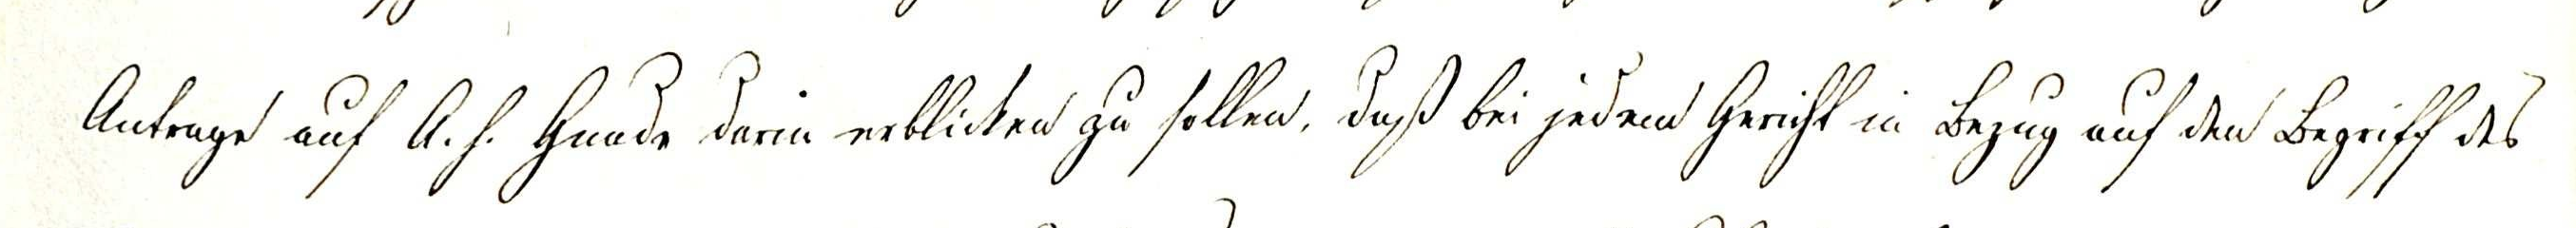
Antrage auf A. h. Gnade darin erblicken zu sollen, daß bei jedem Gericht in Bezug auf den Begriff des
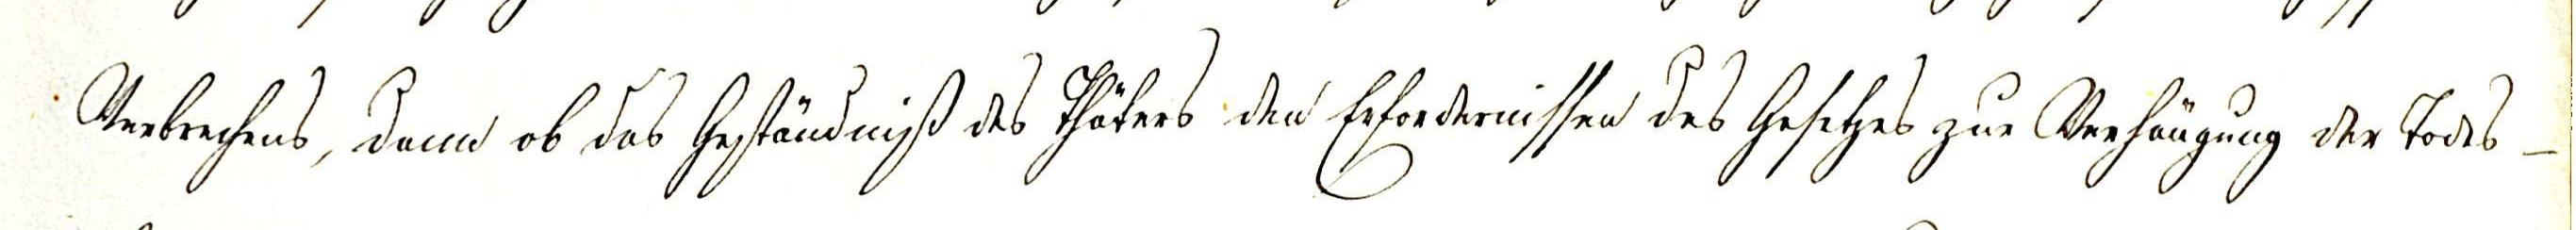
Verbrechens, dann ob das Geständniß des Thäters den Erfordernissen des Gesetzes zur Verhängung der Todes¬
